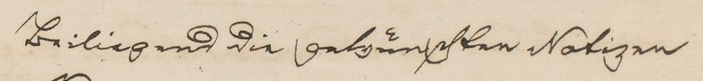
Beiliegend die gewünschten Notizen
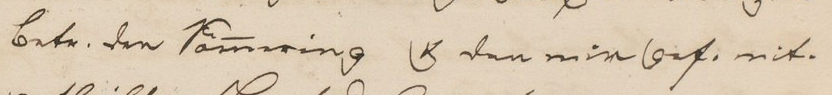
betr. den Sömmering & den mir gef. mit-
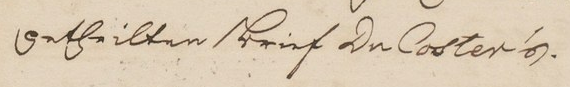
getheilten Brief Du Coster's.
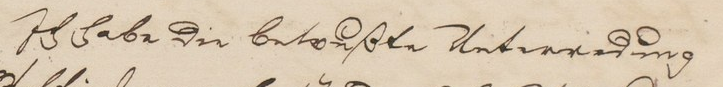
Ich habe die bewußter Unterredung
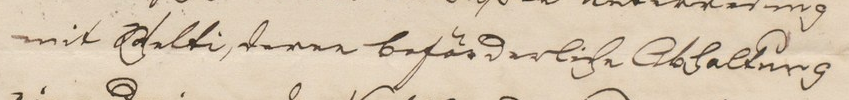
mit Welti, deren beförderliche Abhaltung
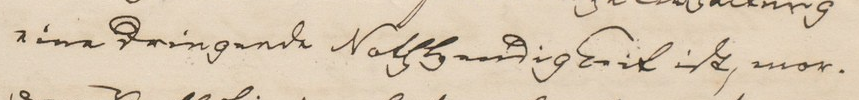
eine dringende Nothwendikeit ist, mor-
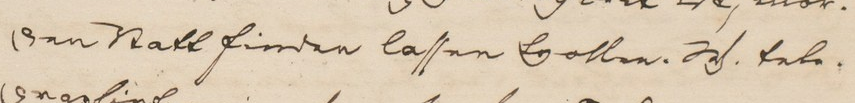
gen Statt finden lassen wollen. W. tele-
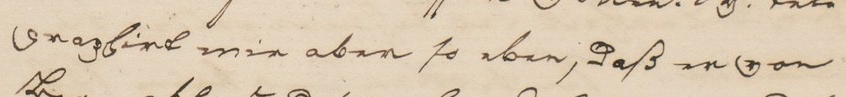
graphirt mir aber so eben, daß er von
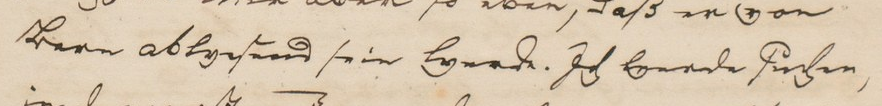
Bern abwesend sein werde. Ich werde suchen,
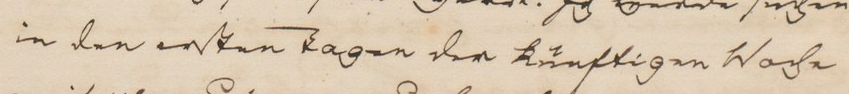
in den ersten Tagen der künftigen Woche
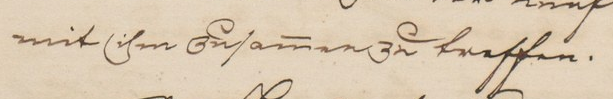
mit ihm zusammen zu treffen.
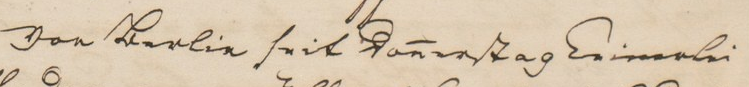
Von Berlin seit Donnerstag keinerlei
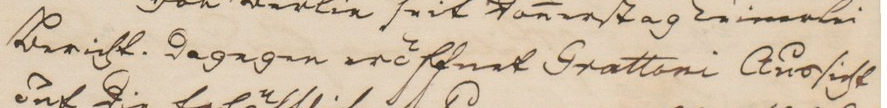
Bericht. Dagegen eröffnet Grattoni Aussicht
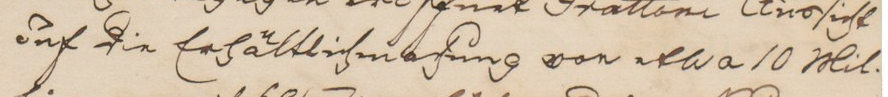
auf die Erhältlichmachung von etwa 10 Mil-
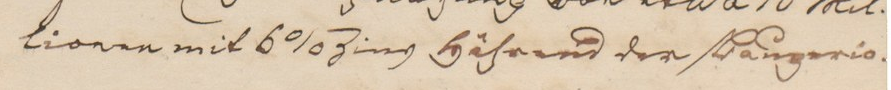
lionen mit 6% Zins während der Bauperio-
